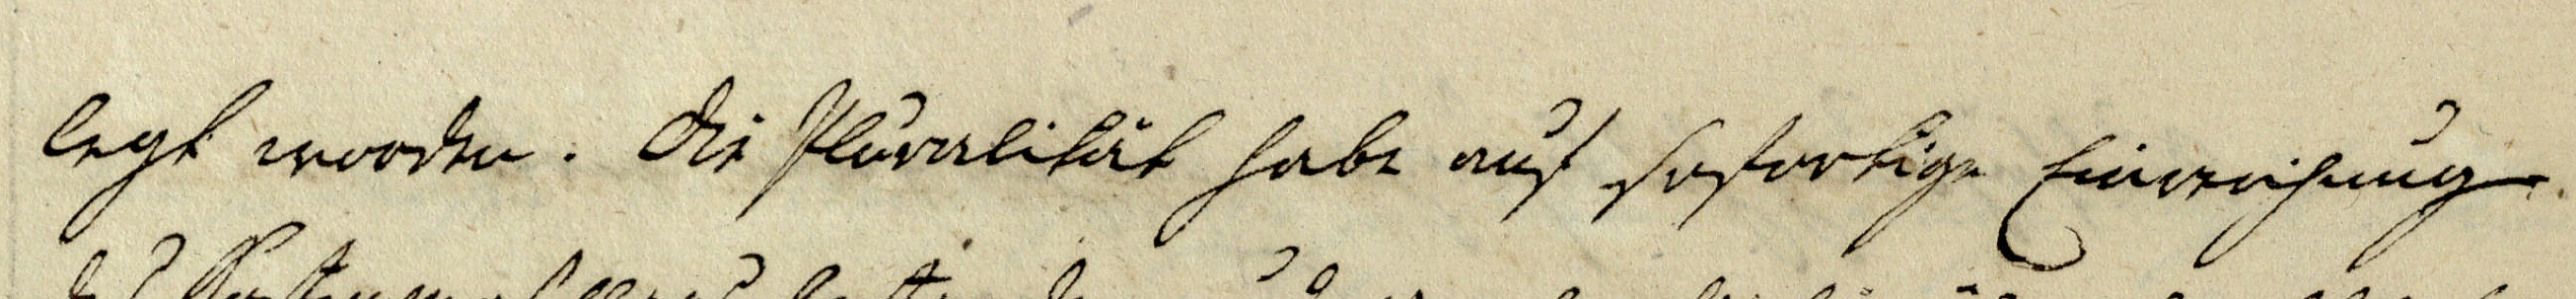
legt worden. Die Pluralität habe auf sofortige Einreichung
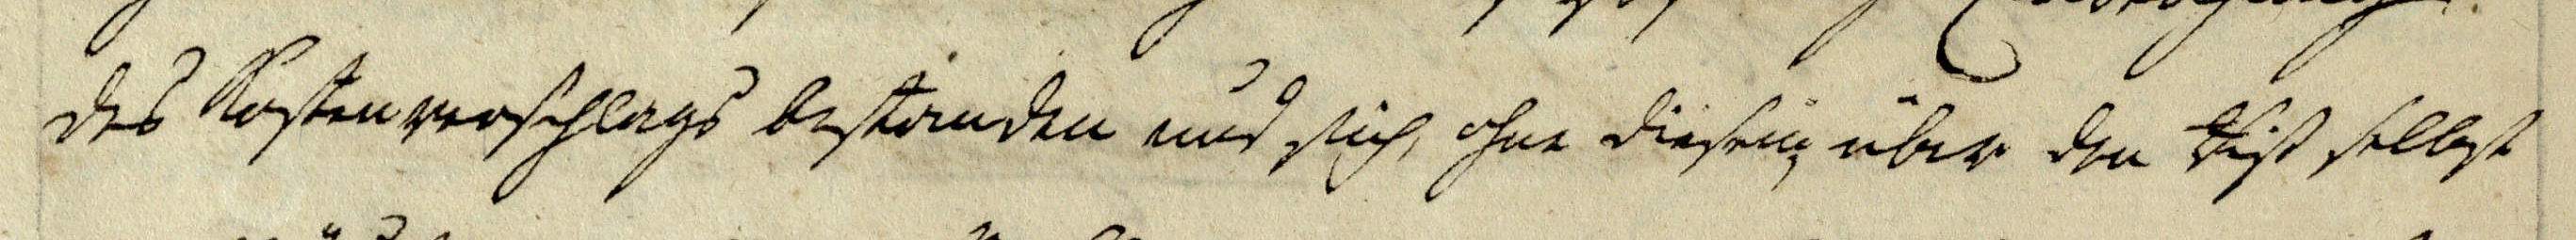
des Kostenverschlages bestanden und sich, ohne diesen, über den Riß selbst
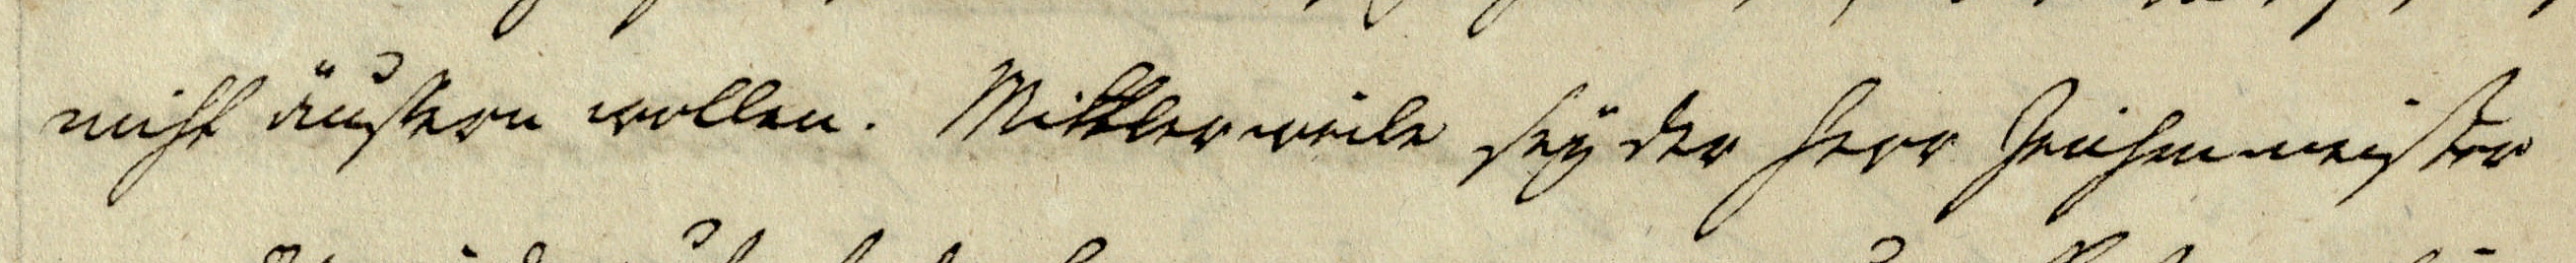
nicht äussern wollen. Mittlerweile seÿ der Herr Zeichenmeister
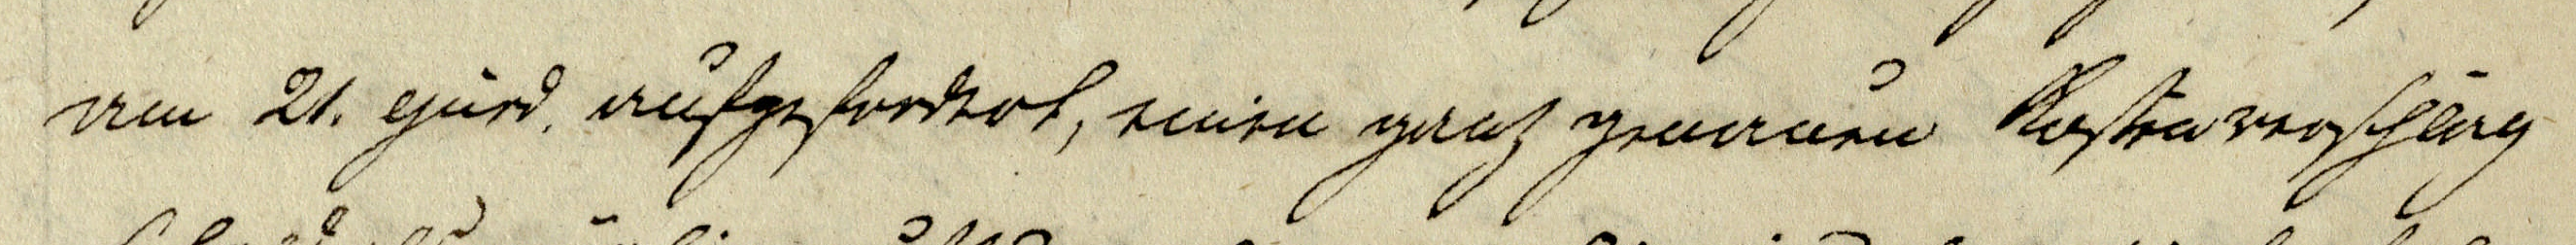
am 21. ejusd. aufgefordert, einen ganz genauen Kostenverschlag
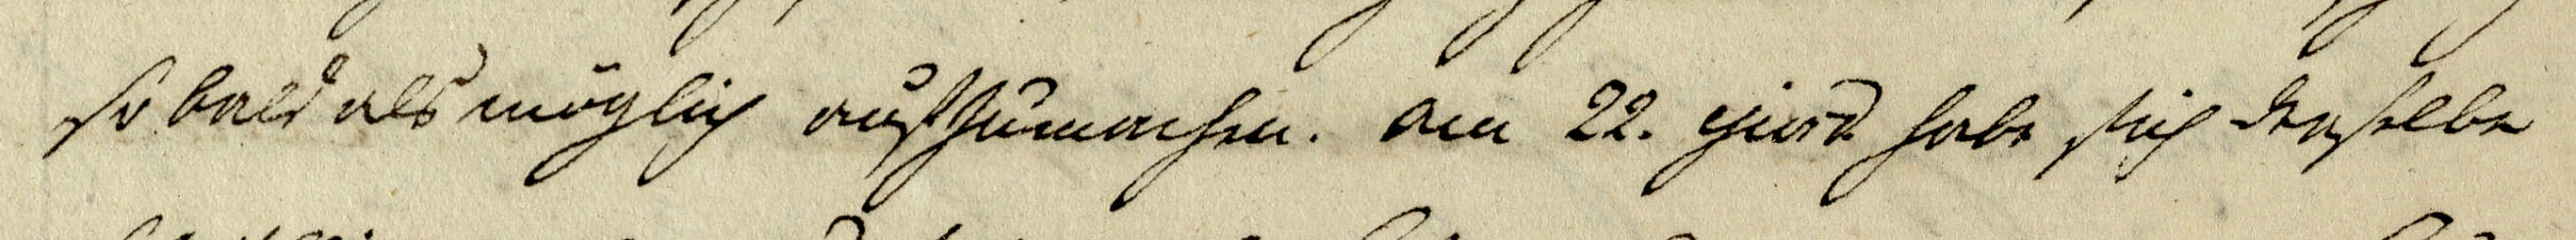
so bald als möglich aufzumachen. Am 22. ejusd. habe sich derselbe
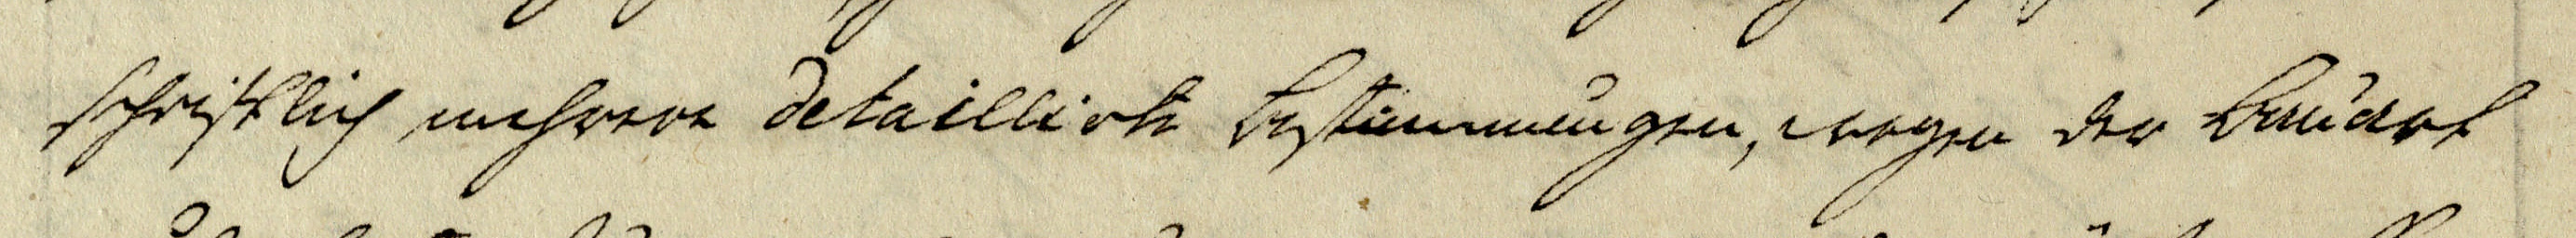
schriftlich mehrere detaillirte Bestimmungen, wegen der Bauart
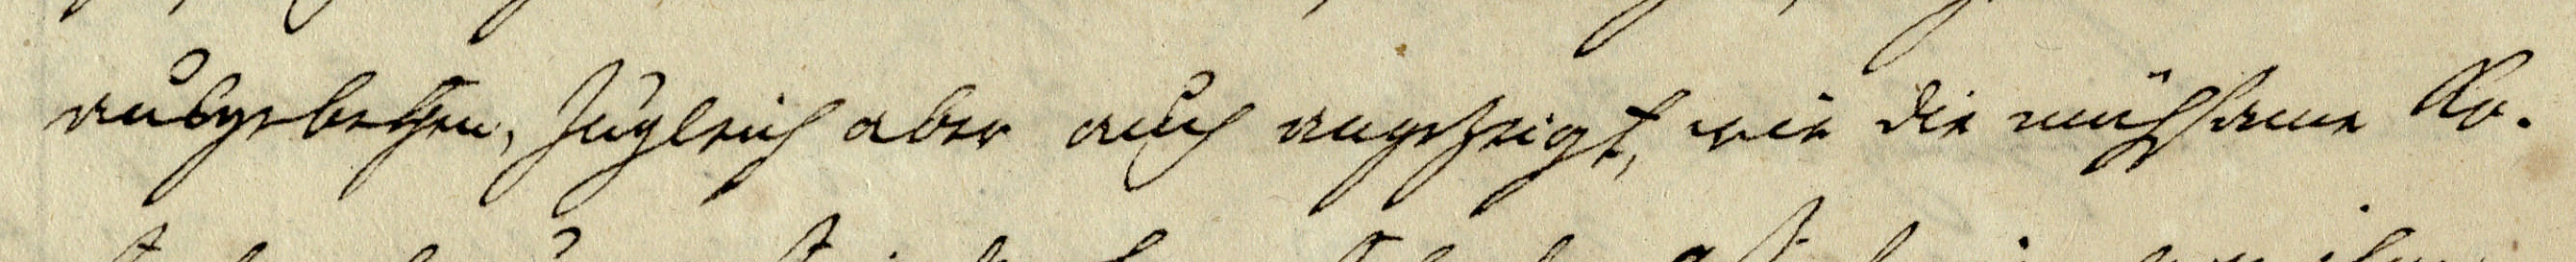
ausgebethen, zugleich aber auch angezeigt, wie die mühsame Ko¬
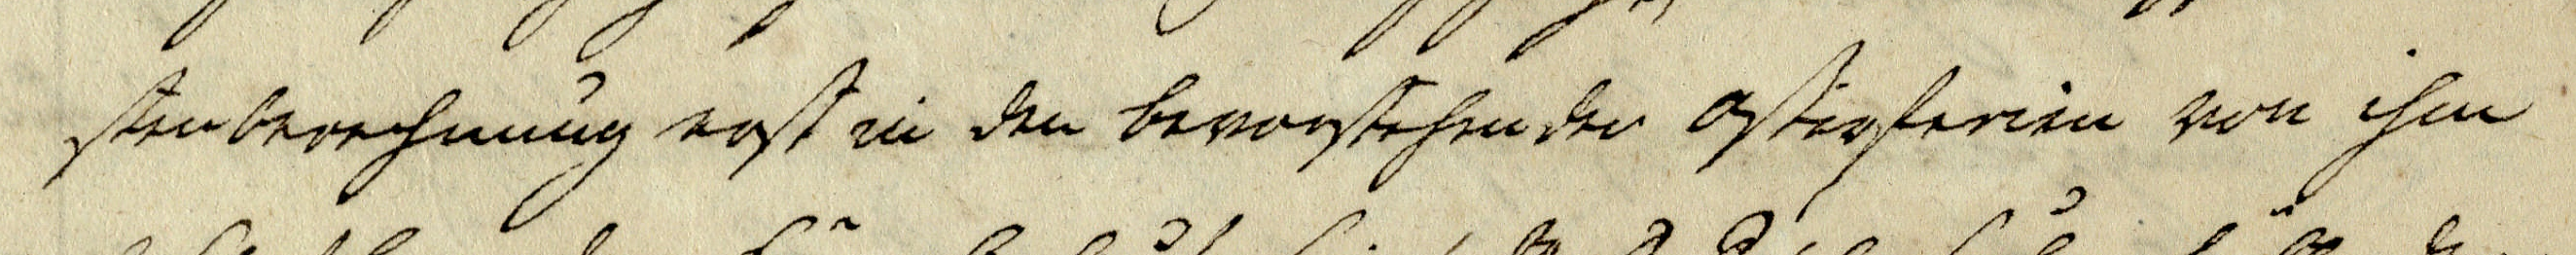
stenberechnung erst in den bevorstehenden Osterferien von ihm
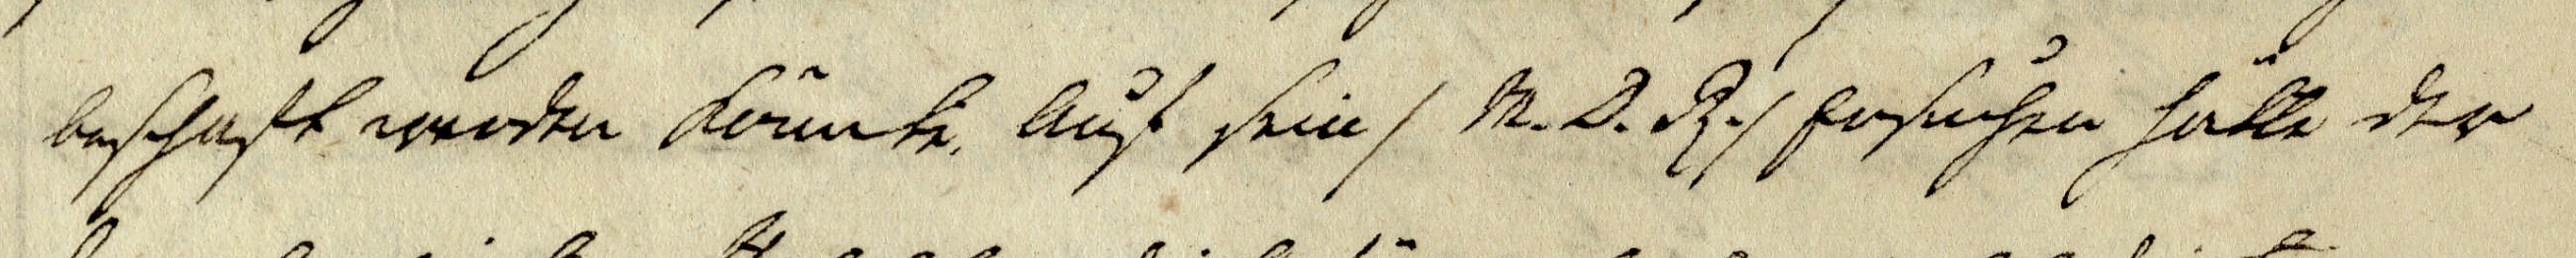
beschaft werden könnte. Auf sein / M. D. R./ Ersuchen hätte der
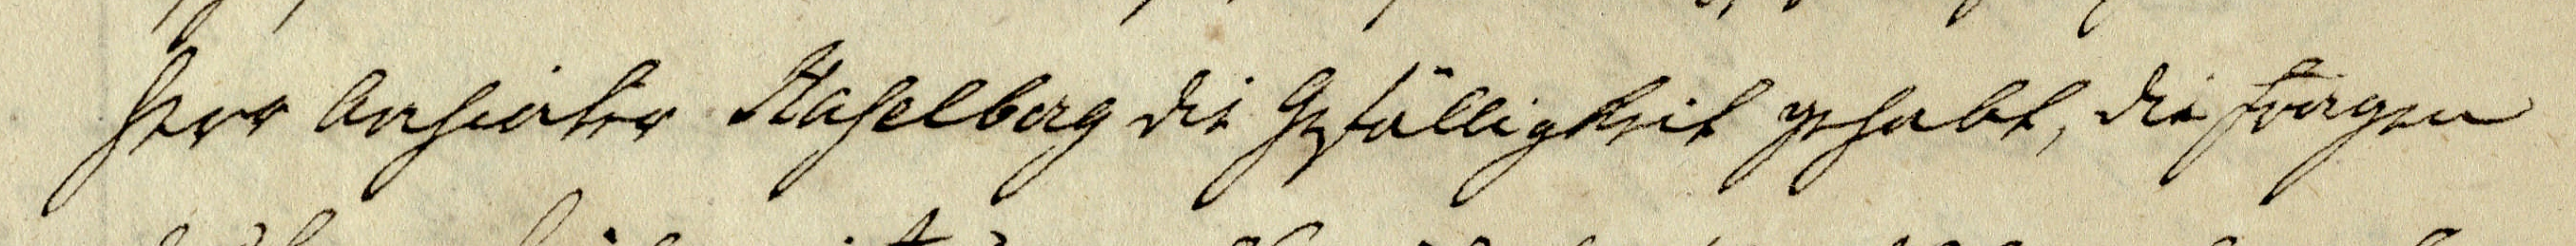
Herr Archiater Haselberg die Gefälligkeit gehabt, die Fragen
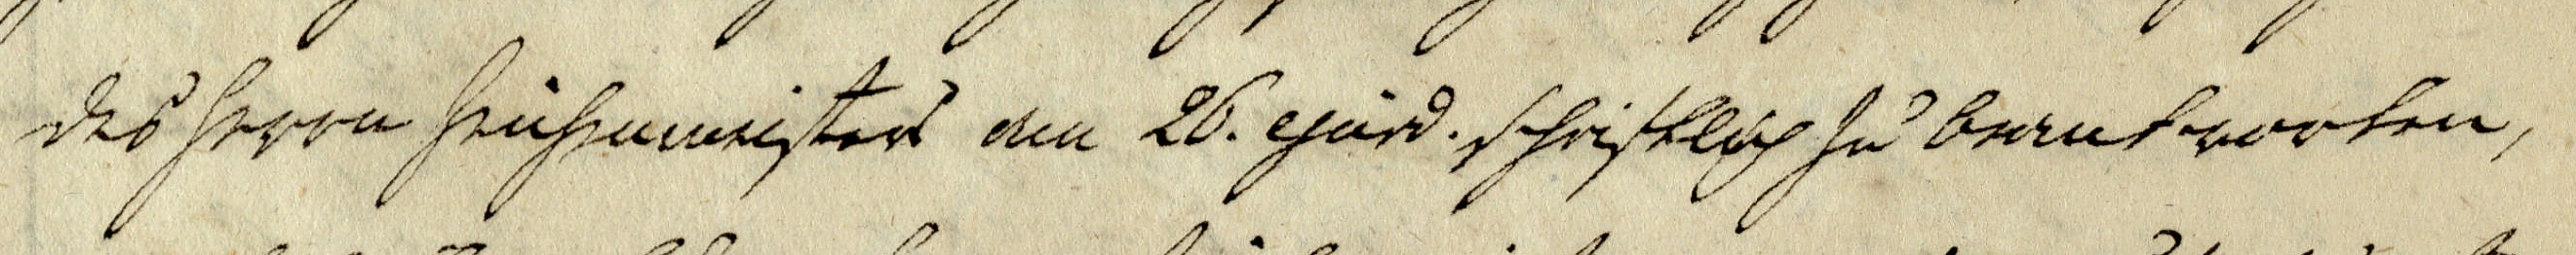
des Herrn Zeichenmeisters am 26. ejusd. schriftlich zu beantworten,
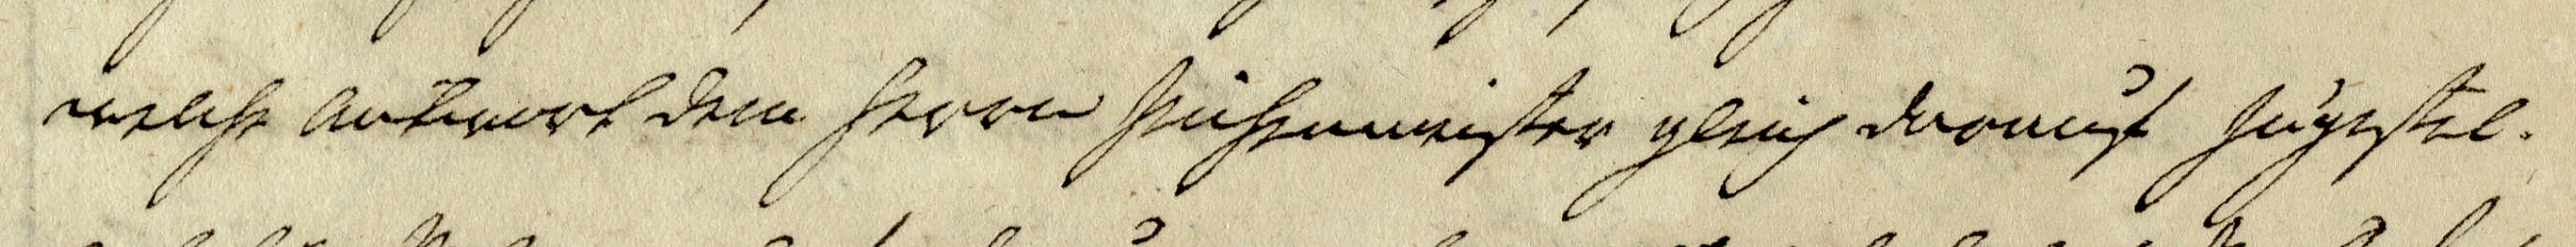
welche Antwort dem Herrn Zeichenmeister gleich darauf zugestel¬
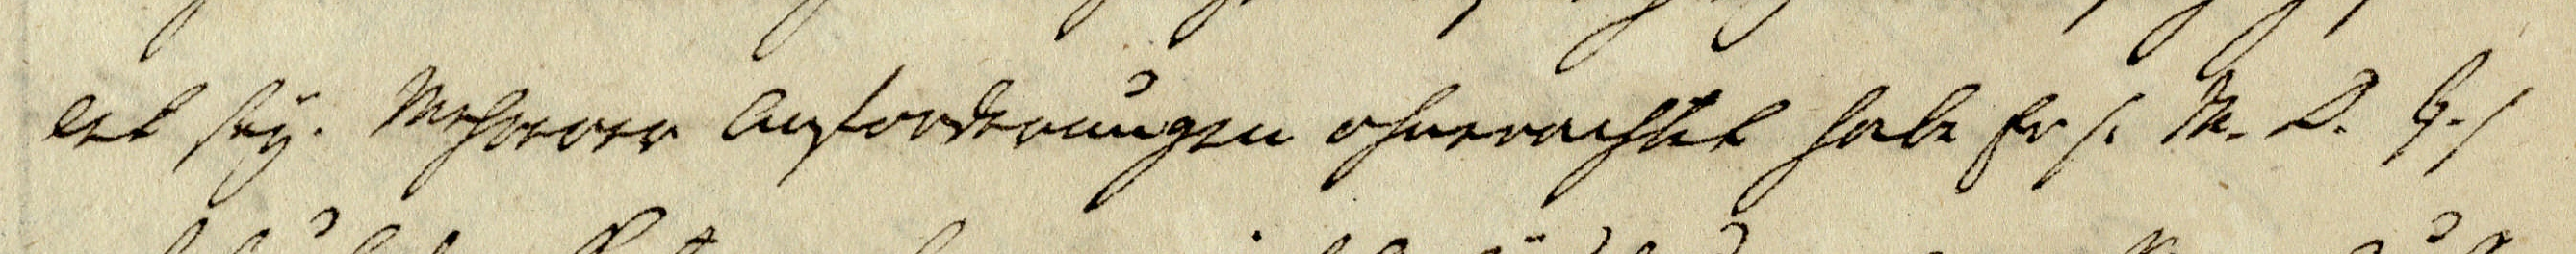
let seÿ. Mehrerer Anforderungen ohnerachtet habe Er /. M. D. R./
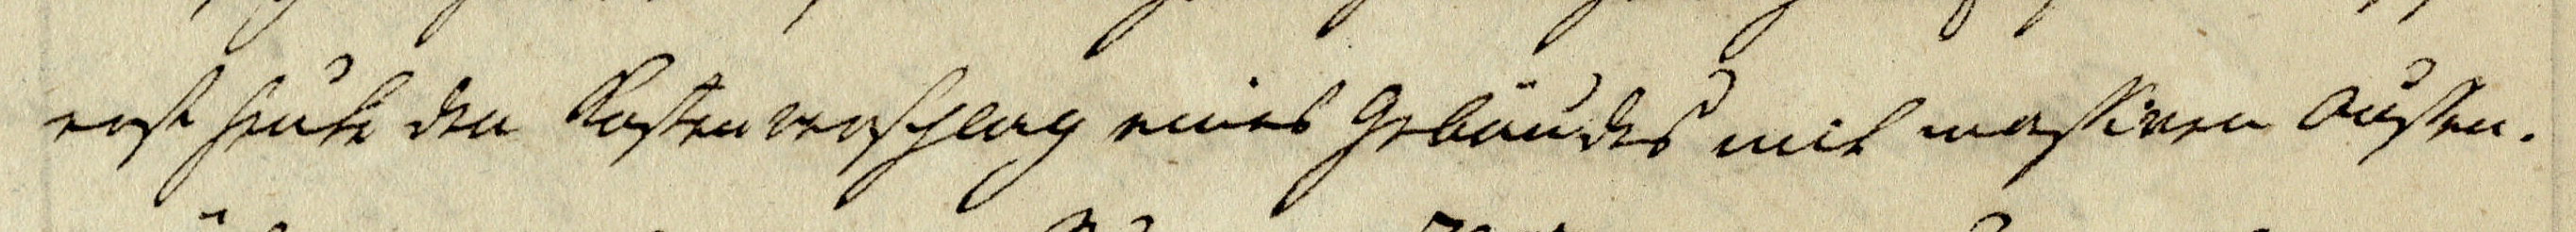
erst heute den Kostenverschlag eines Gebäudes mit massiven Aussen¬
